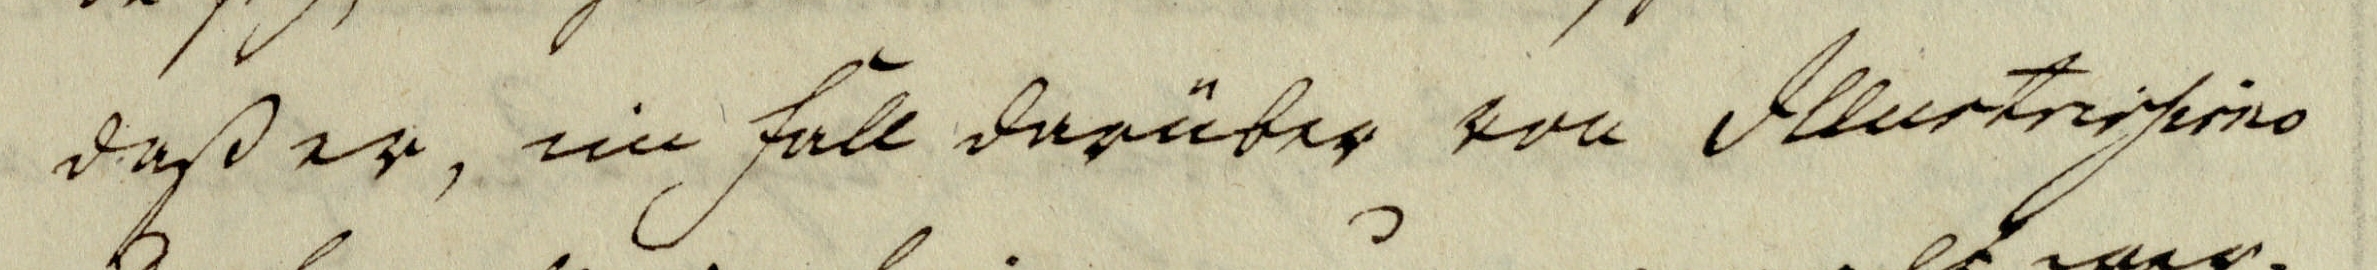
daß er, im Fall darüber von Illustrissimo
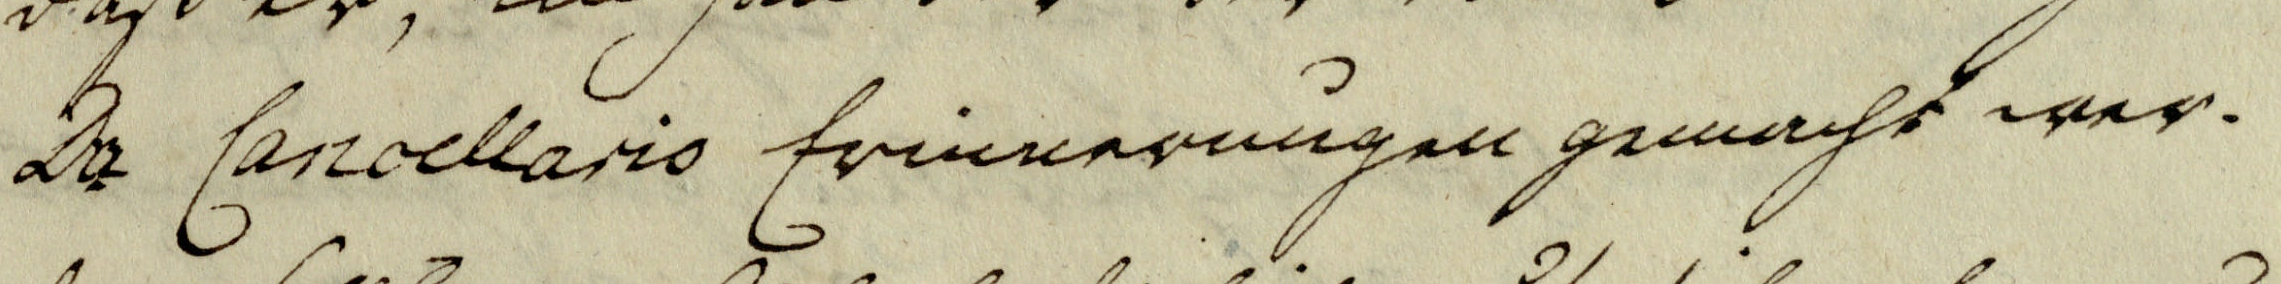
Dn Cancellario Erinnerungen gemacht wer¬
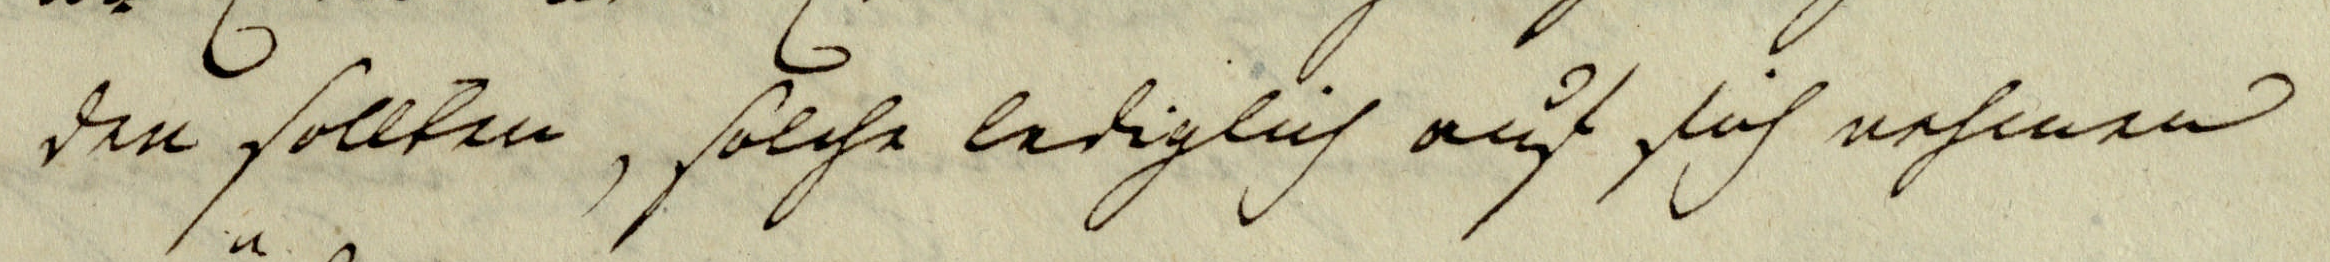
den sollten, solche lediglich auf sich nehmen
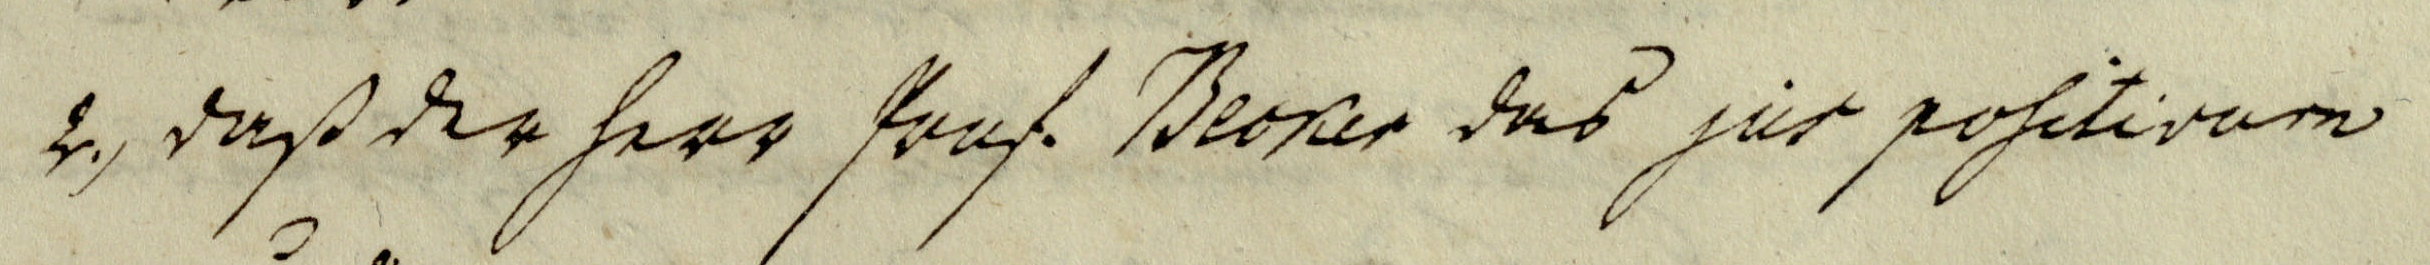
2., daß der Herr Prof. Becker das jus positivum
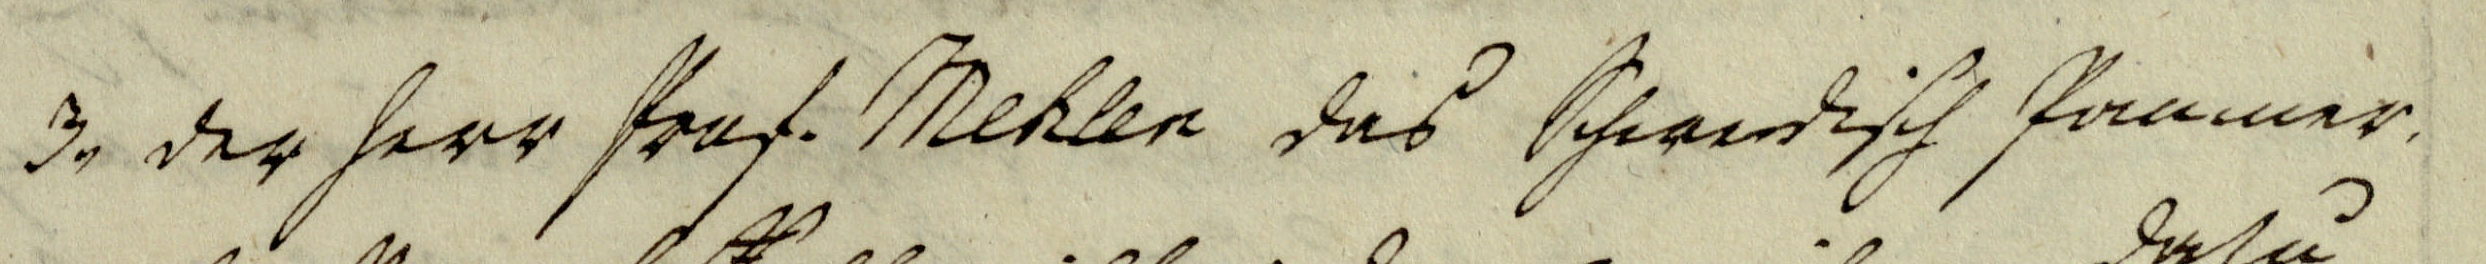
3. der Herr Prof. Mehlen das Schwedisch Pommer¬
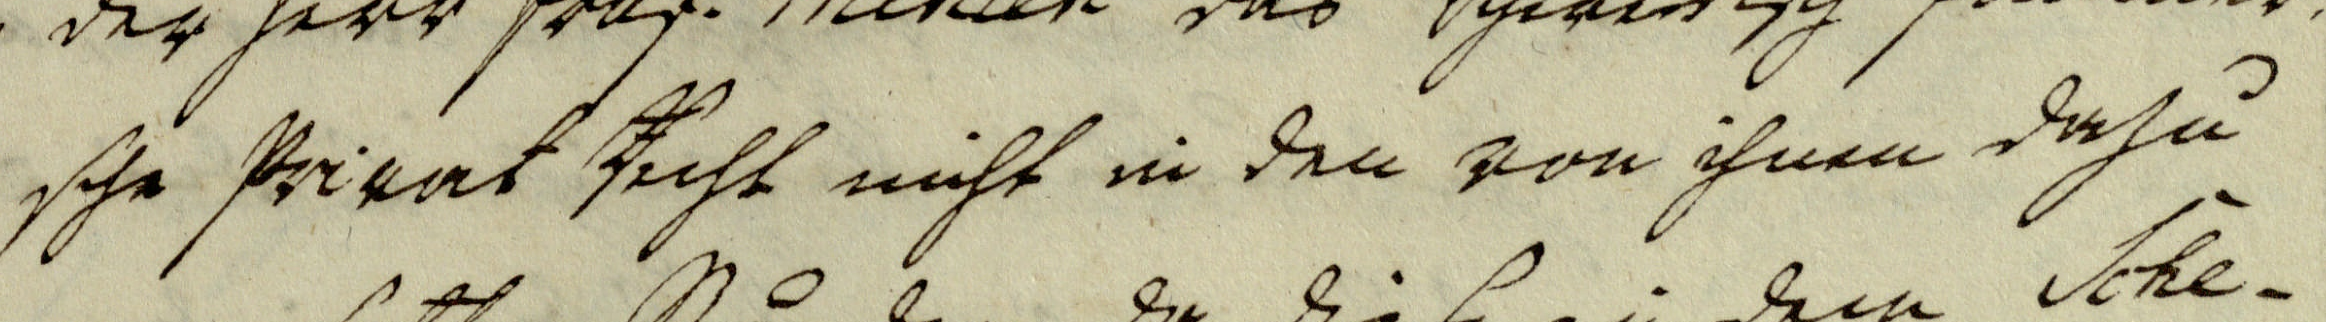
sche Privat Recht nicht in den von ihnen dazu
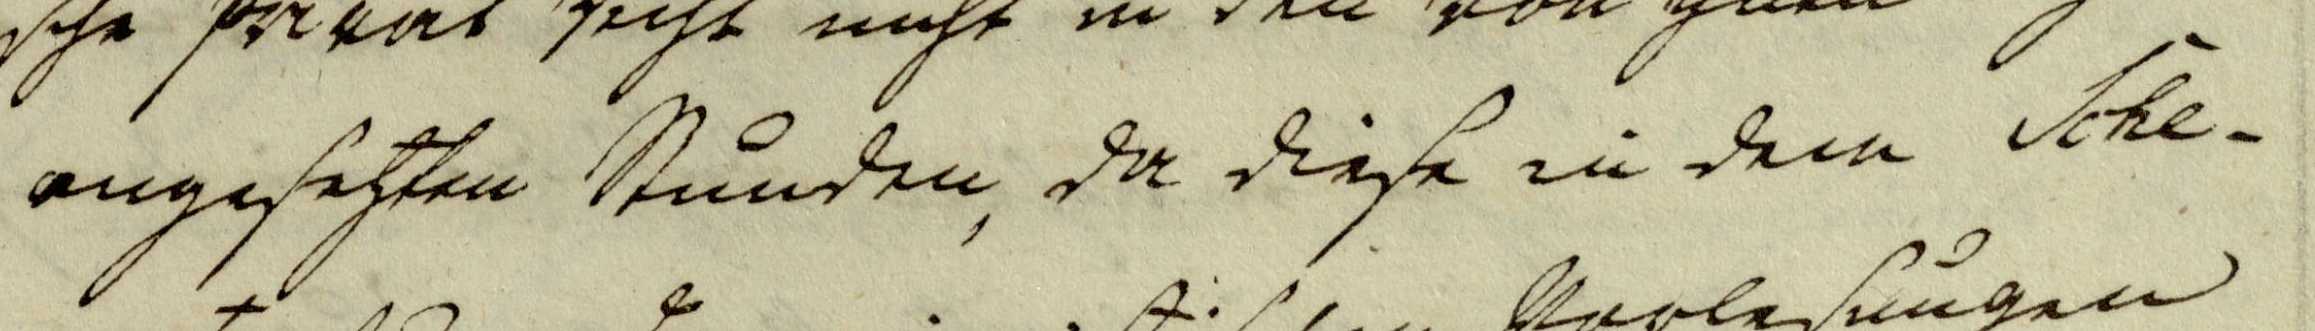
angesetzten Stunden, da diese in dem Sche¬
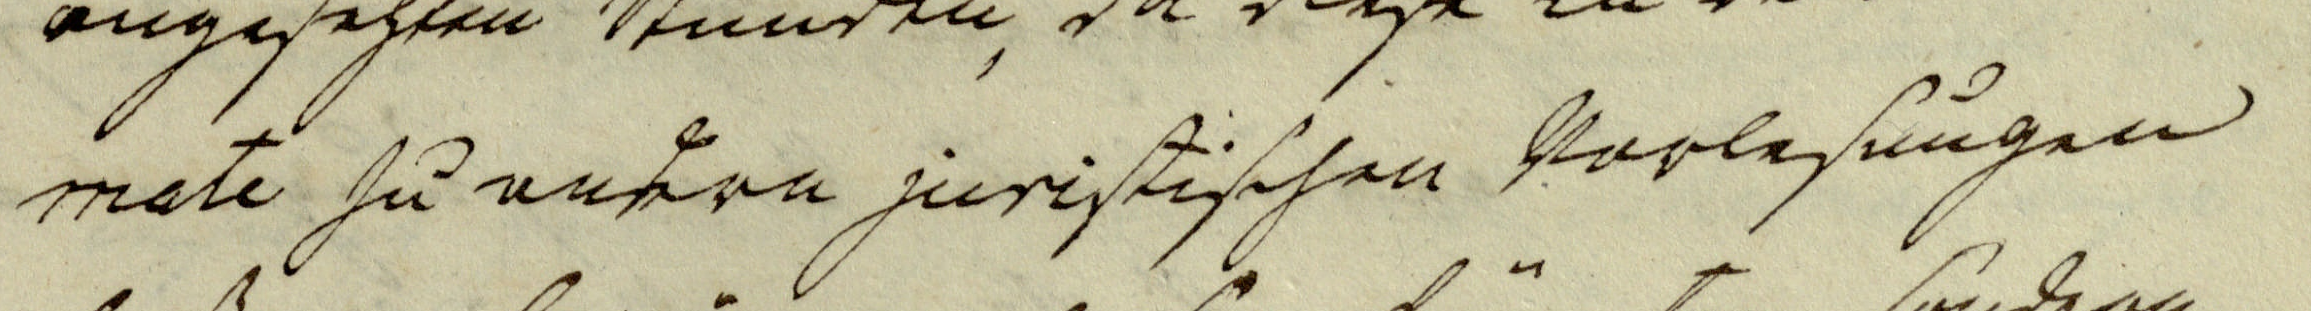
mate zu andern juristischen Vorlesungen
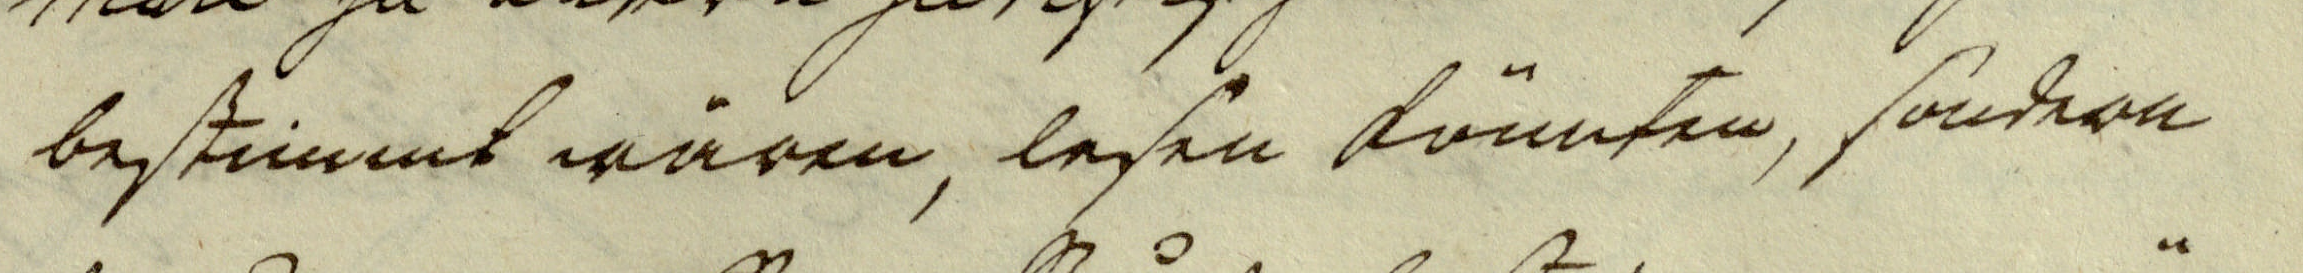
bestimmt wären, lesen könnten, sondern
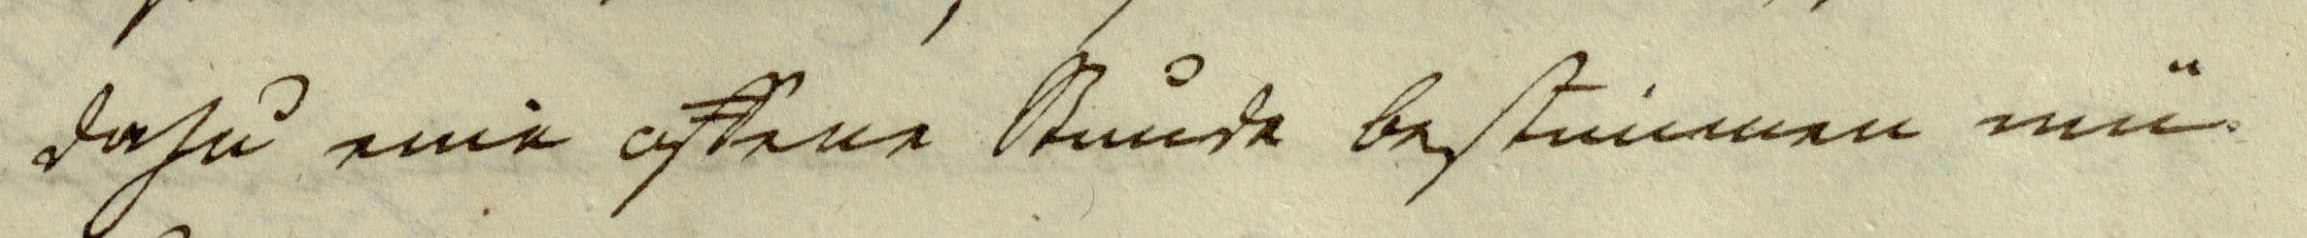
dazu eine offene Stunde bestimmen mü¬
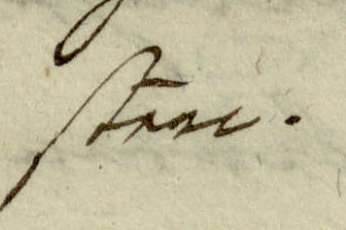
sten.
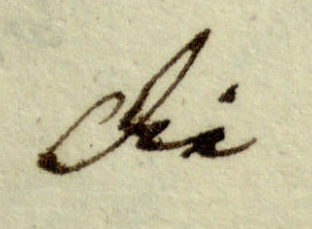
Die
